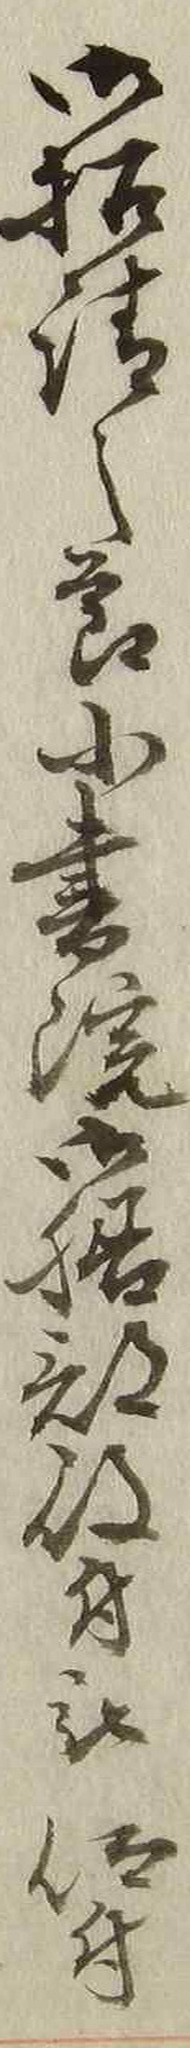御招請之節小書院御膳部役付被仰付
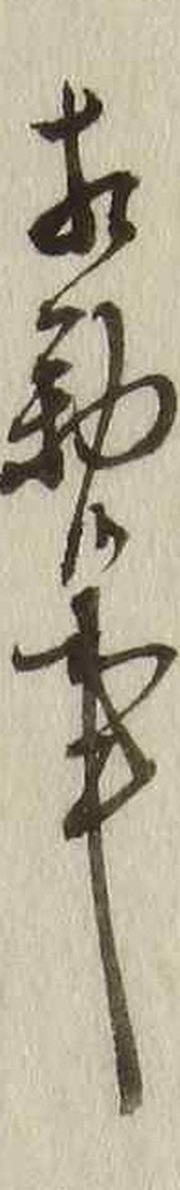相勤候候
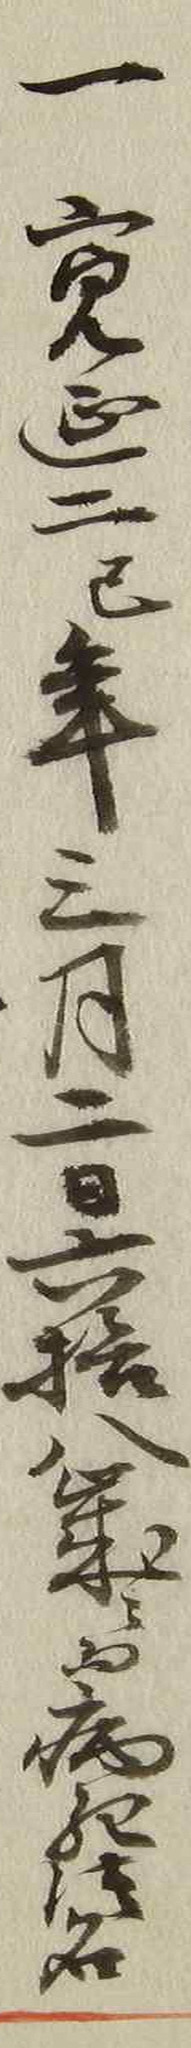一寛延二巳年三月二日六拾八歳ニ而病死法名
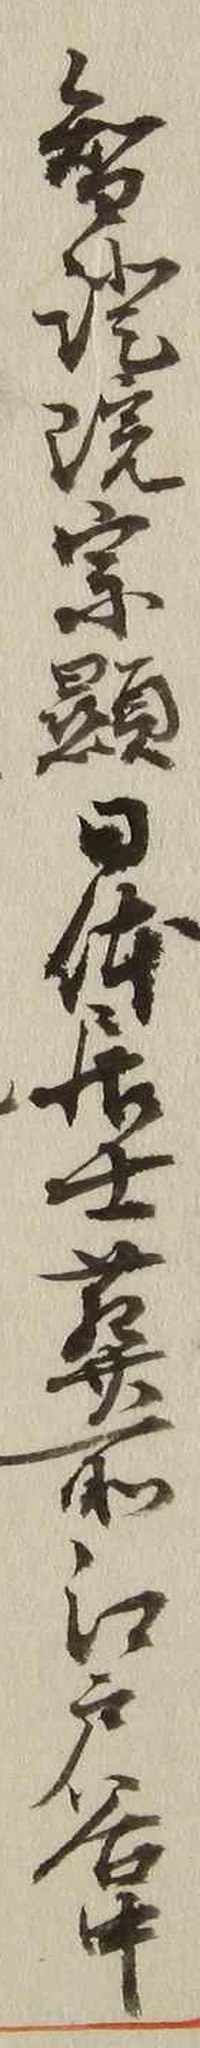智証院宗顕日体居士葬所江戸谷中
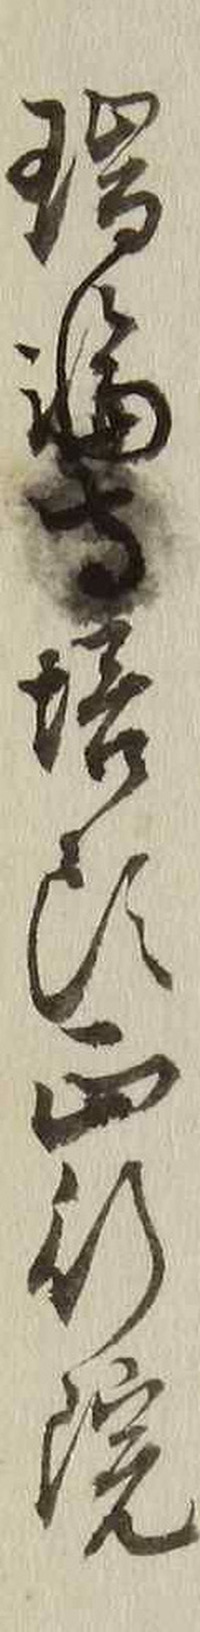瑞輪寺塔頭正行院
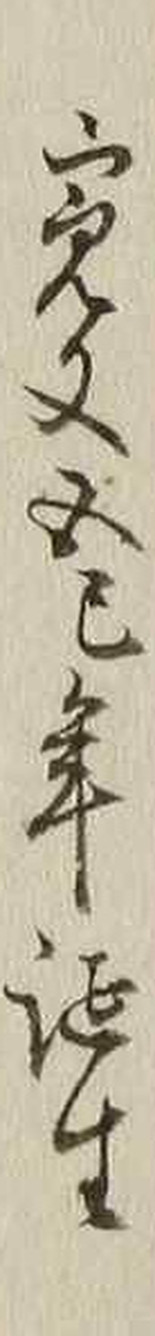寛文五巳年誕生
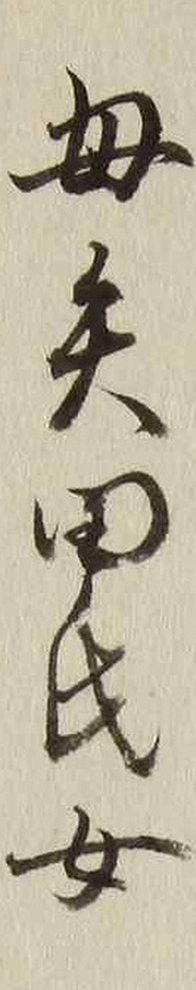母矢田氏女
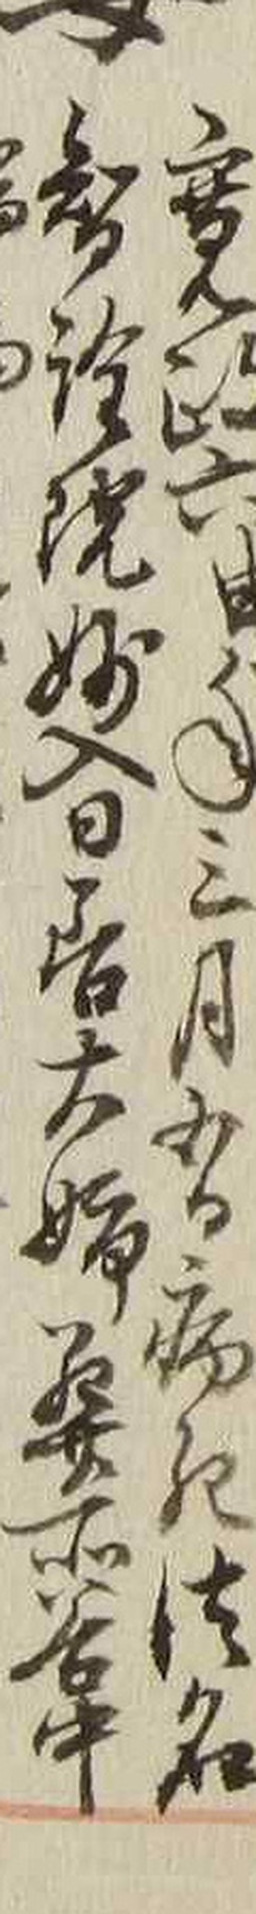智詮院妙入日善大姉葬所谷中
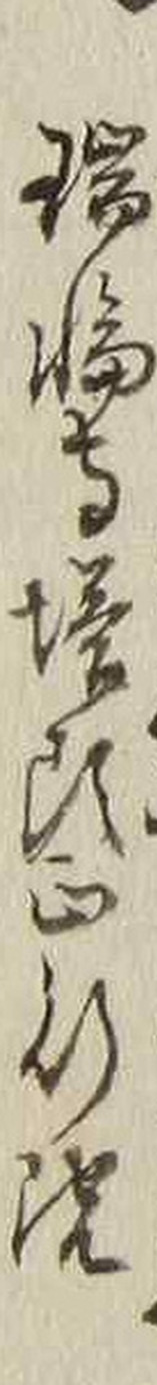瑞輪寺塔頭正行院
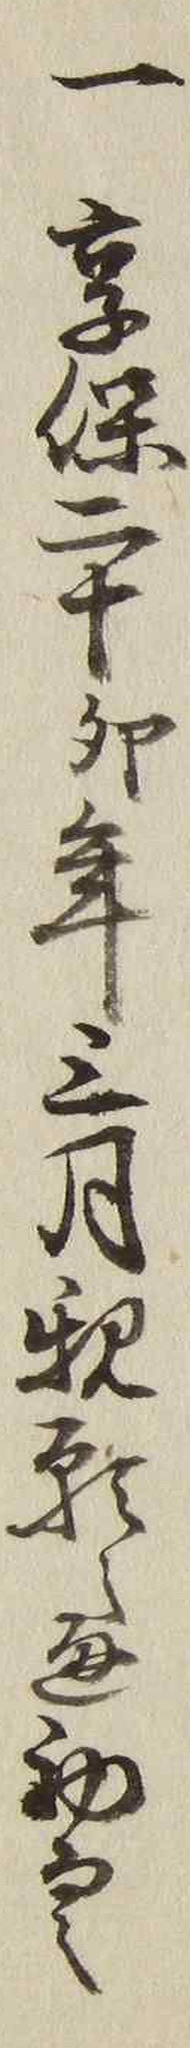一享保二十卯年三月親願之通初而之
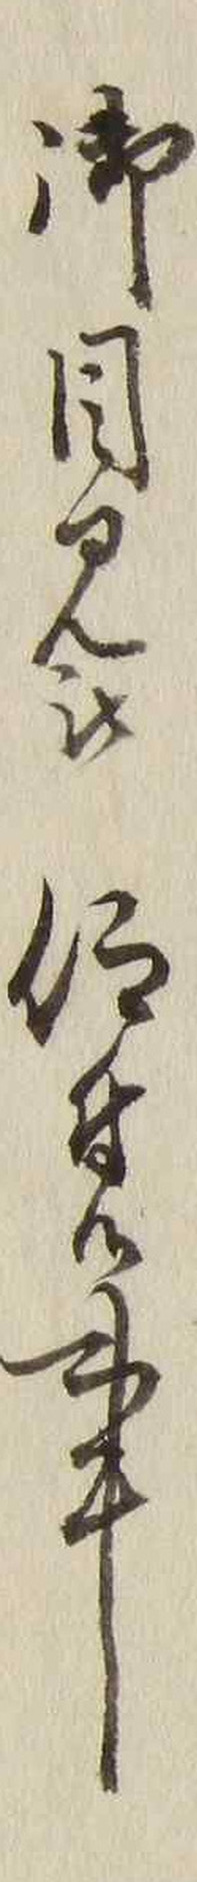御目見被仰付候事

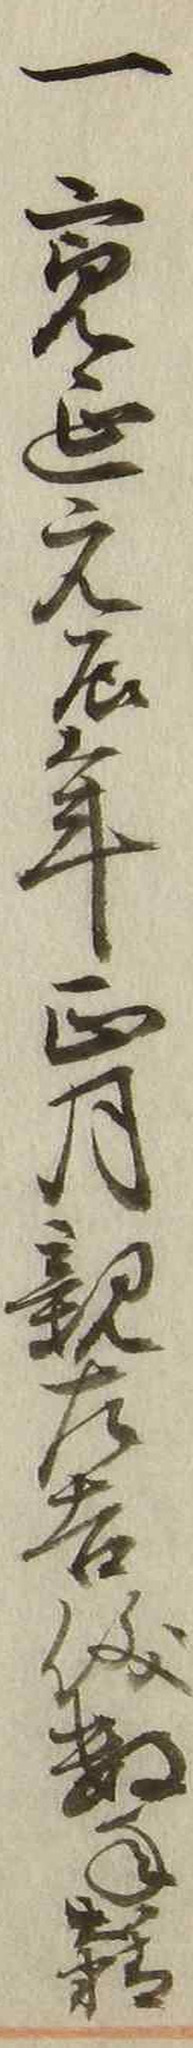一寛延元辰年正月親左吉儀数年出精
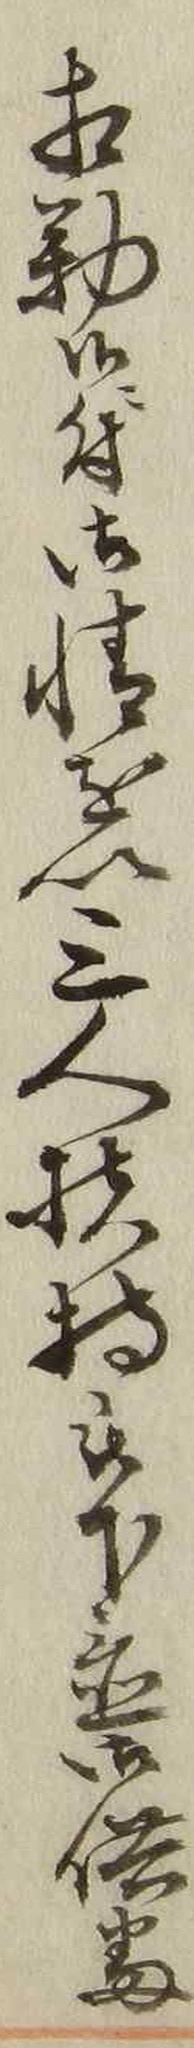相勤候ニ付御情を以三人扶持被下置御供番
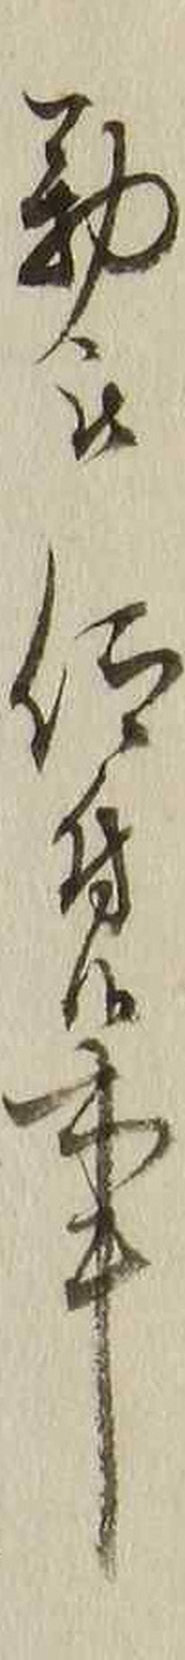勤被仰付候事
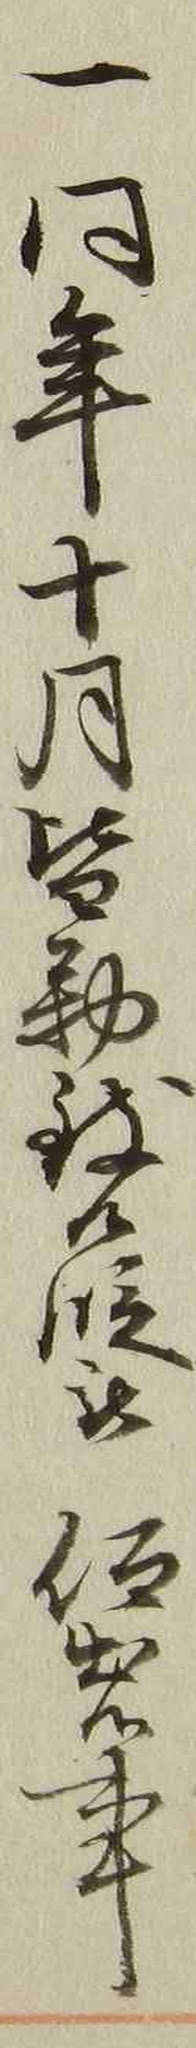一同年十月皆勤致候段被仰出候事
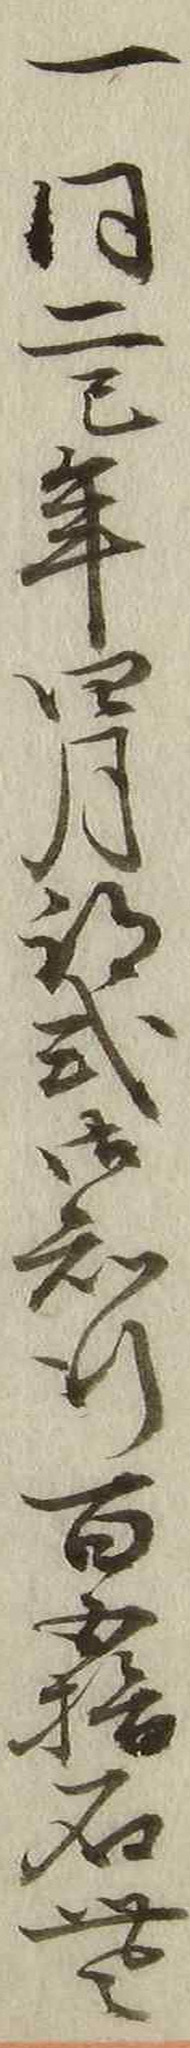一同二巳年四月跡式御知行百五拾石無
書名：諸士系譜　巻之23　い之部23
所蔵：会津若松市立会津図書館
